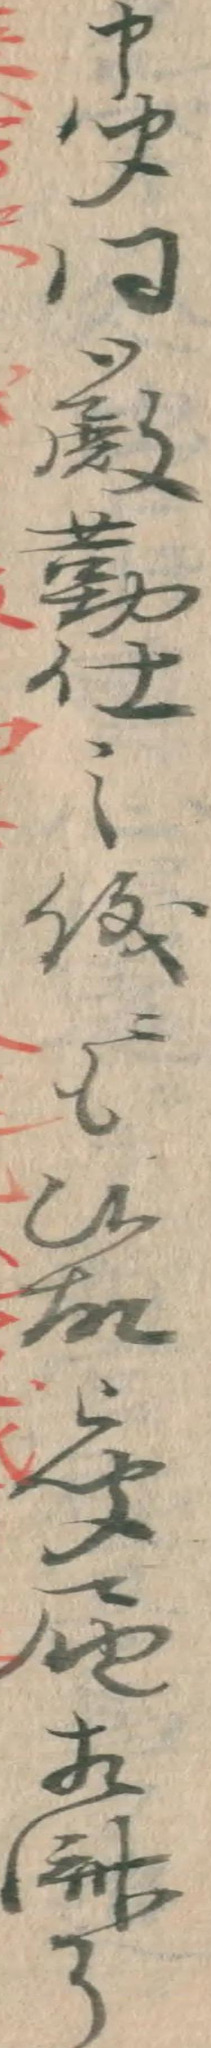申聞同御殿勤仕之儀ニも候故被聞届相済了
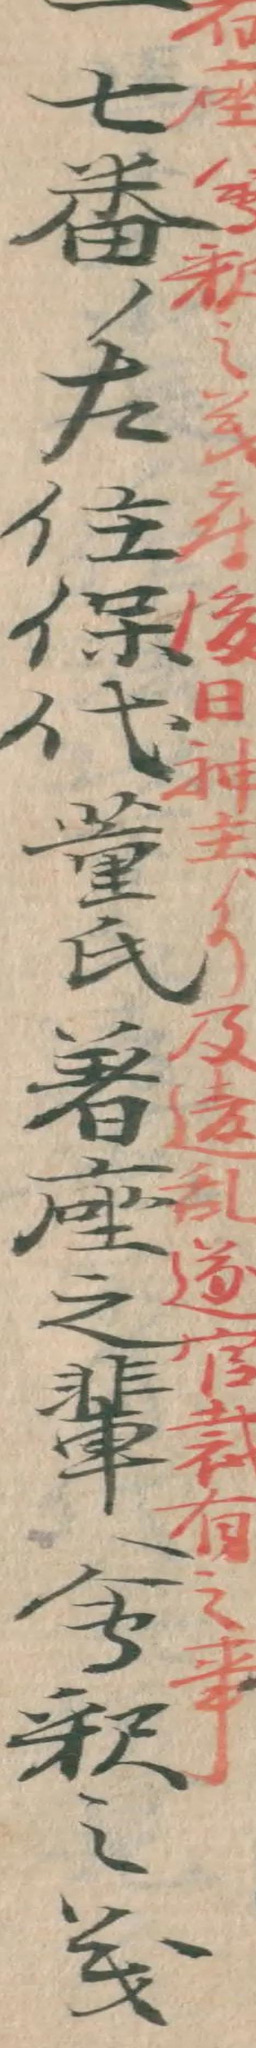一七番ノ左住保代董氏着座之輩ヘ会釈之義
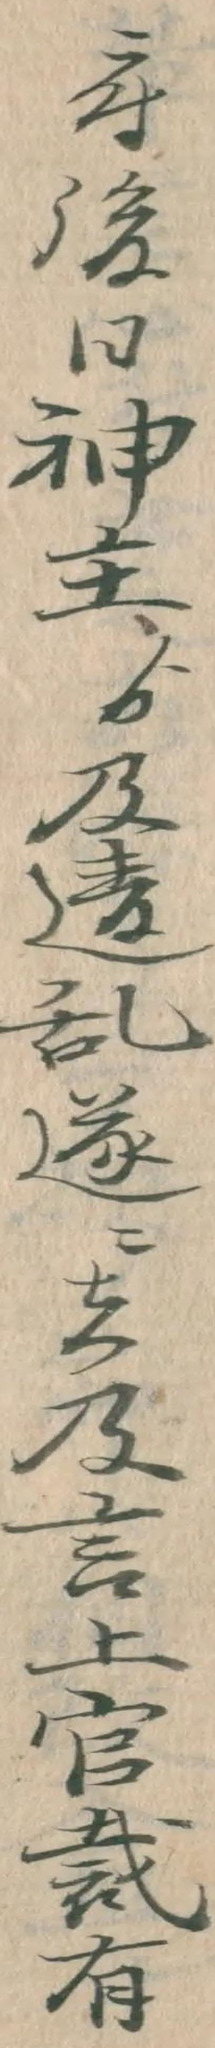ニ付後日神主ゟ及違乱遂ニ者及言上官裁有

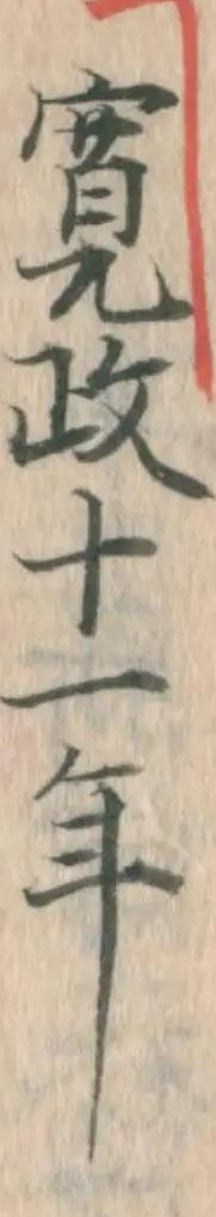寛政十一年
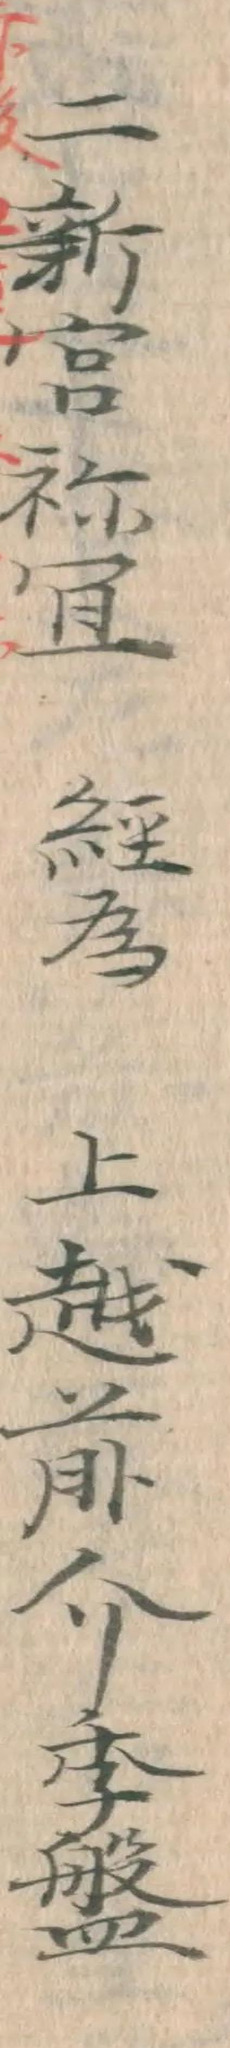二新宮祢宜経為上越前介季盤
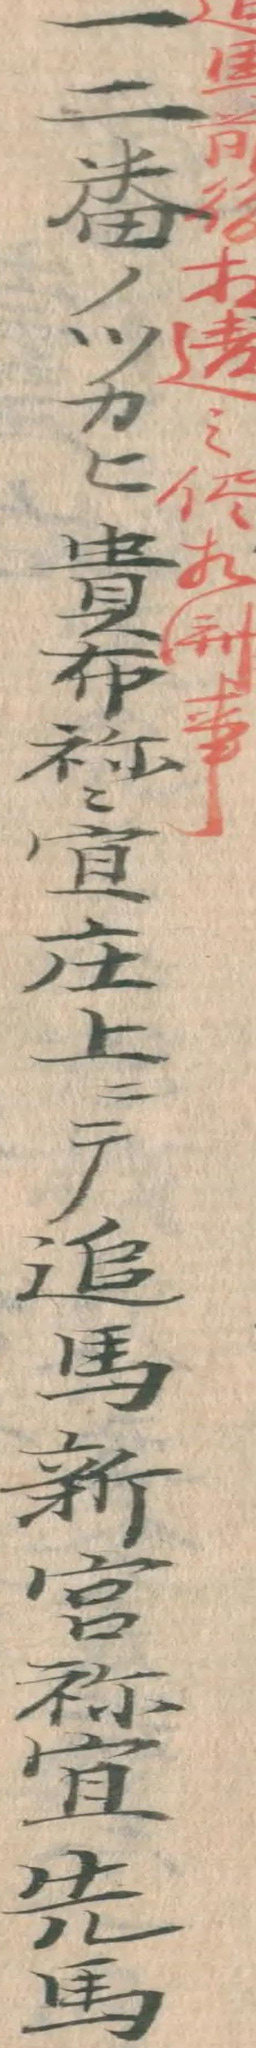一二番ノツカヒ貴布祢々宜庄上ニテ追馬新宮祢宜先馬
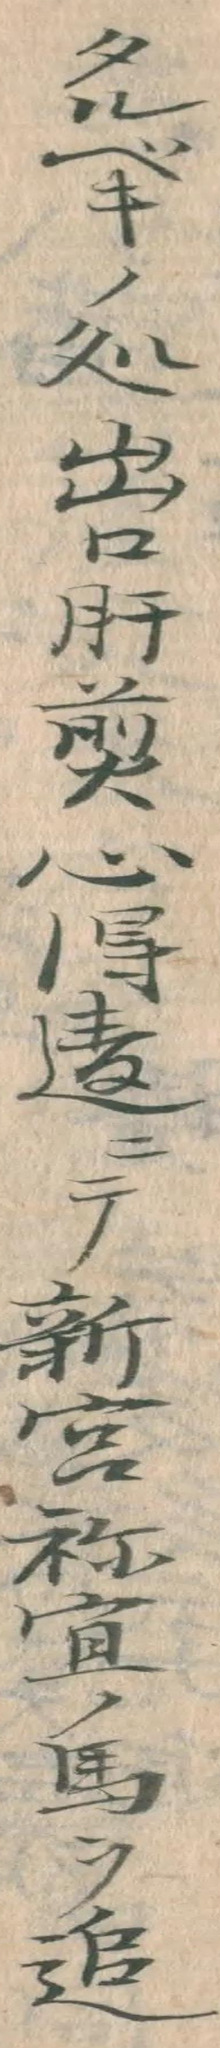タルベキノ処出口肝煎心得違ニテ新宮祢宜ノ馬ヲ追
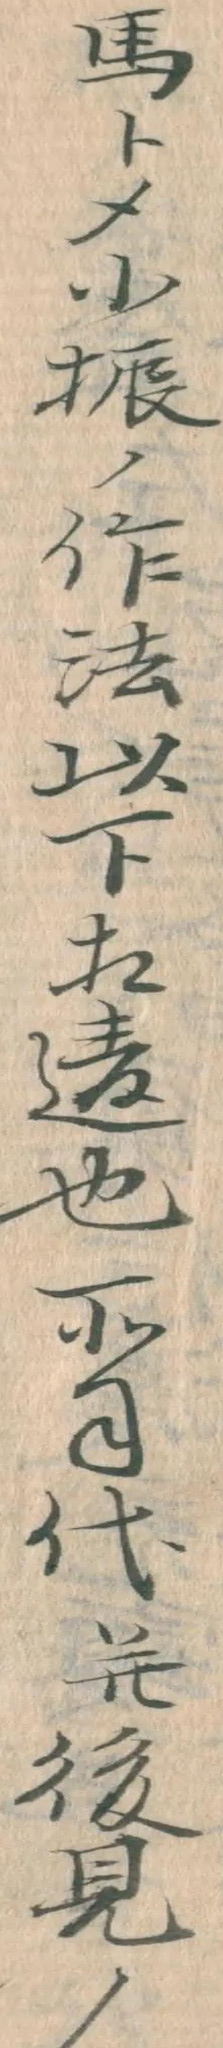馬トシテ小振ノ作法以下相違也所司代并後見ノ
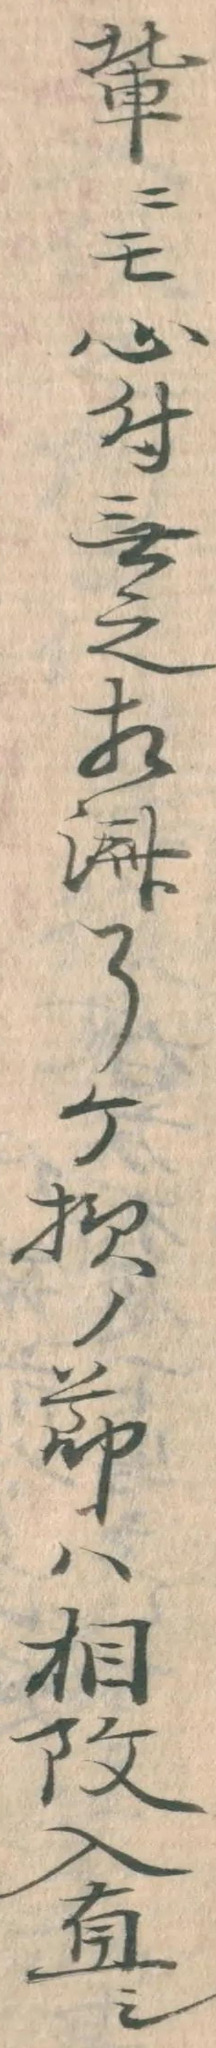輩ニモ心付無之相済了ケ様ノ節ハ相改入直シ
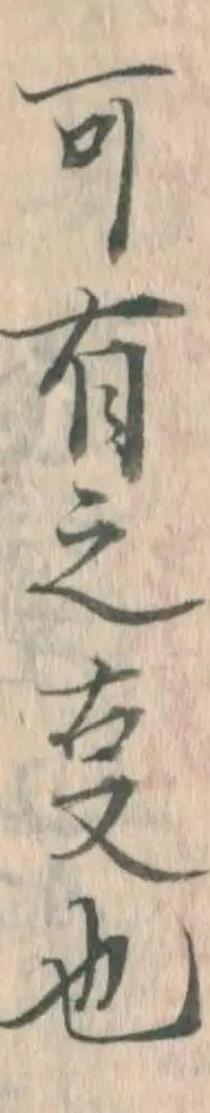可有之事也
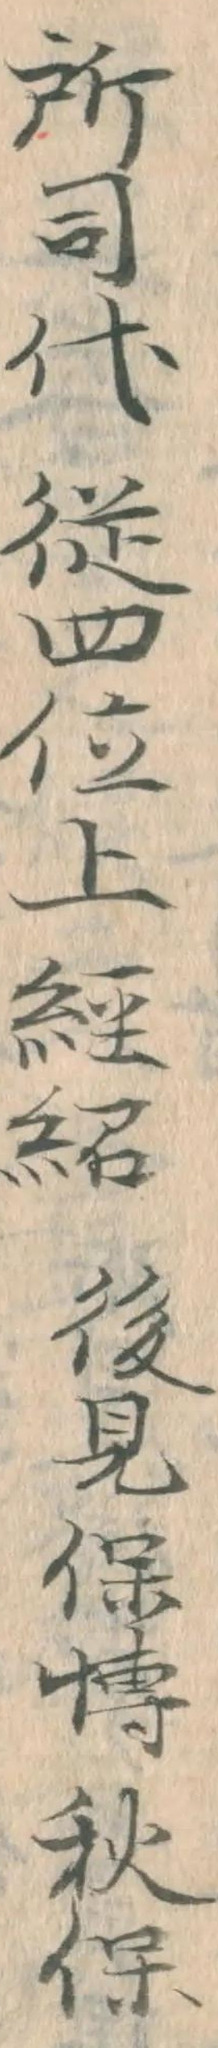所司代従四位上経紹後見保博秋保
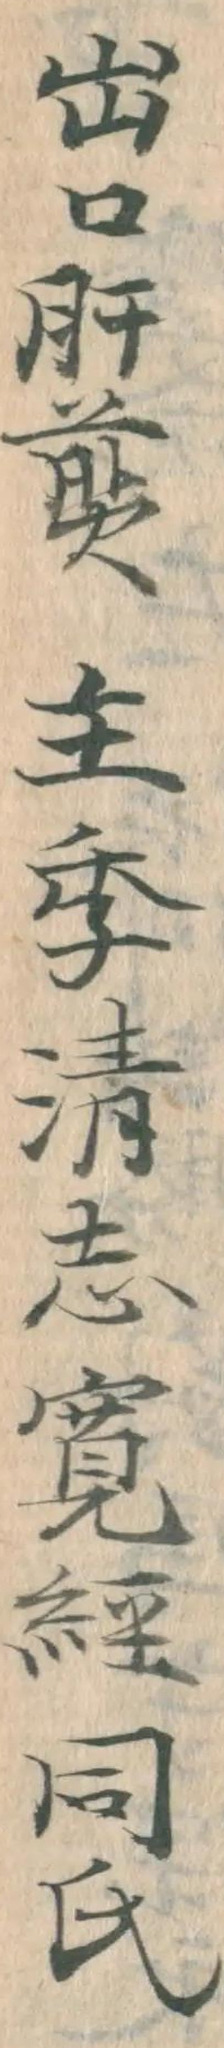出口肝煎主季清志寛経同氏

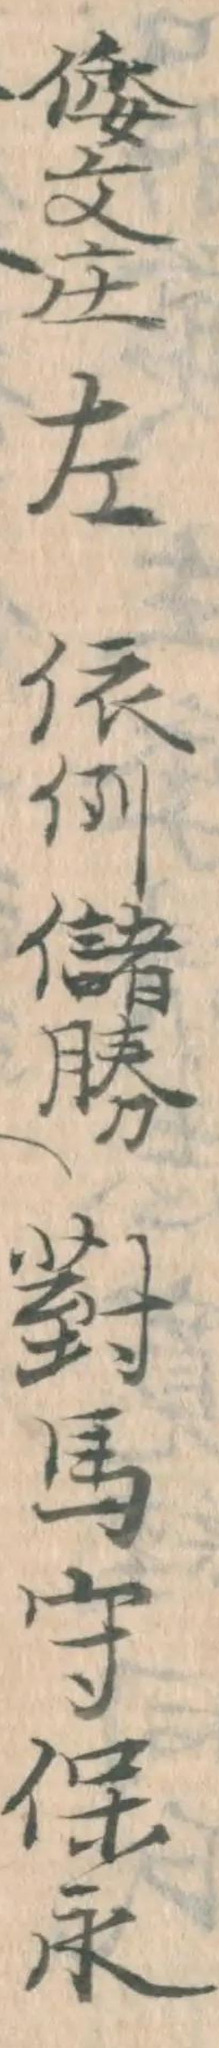倭文庄左依例儲勝對馬守保永
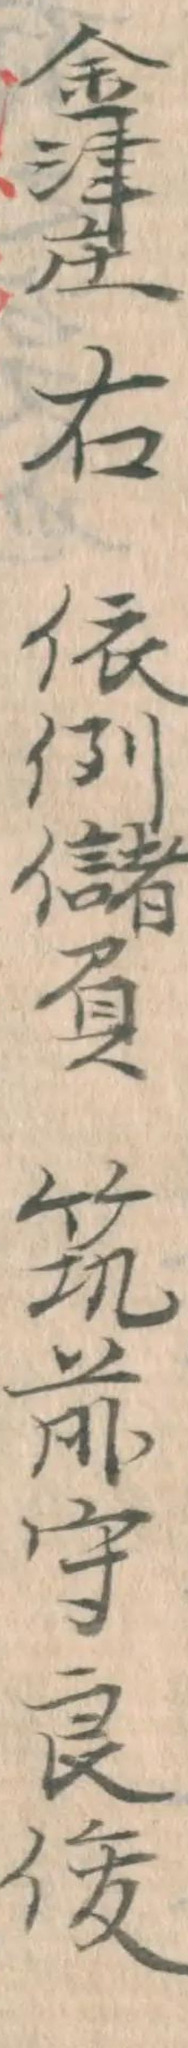金津庄右依例儲負筑前守良俊
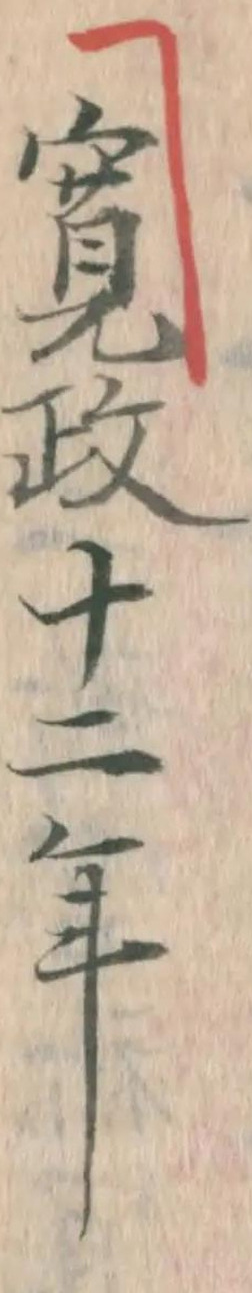寛政十二年
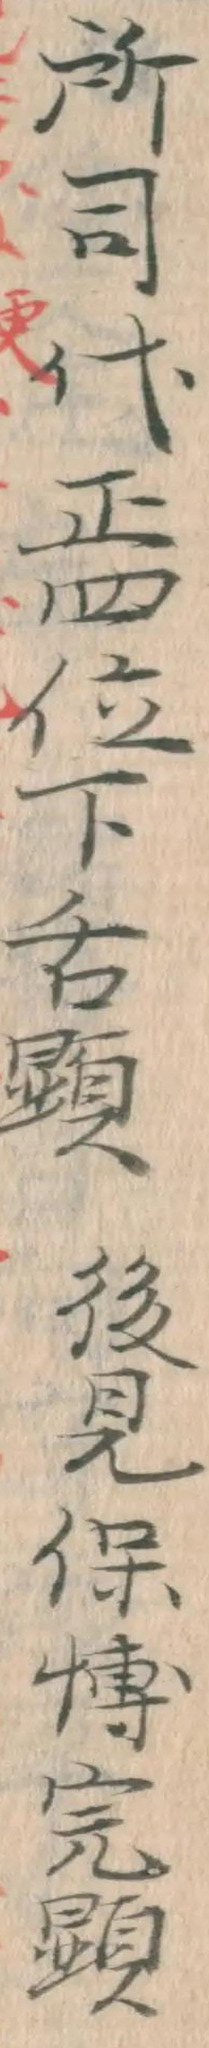所司代正四位下舌顕後見保博完顕
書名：賀茂社記録. 第10冊
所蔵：国立国会図書館 National Diet Library, JAPAN
